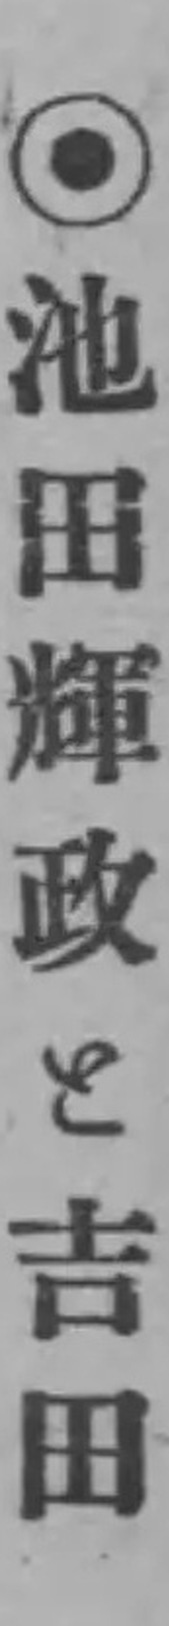⦿池田輝政と吉田
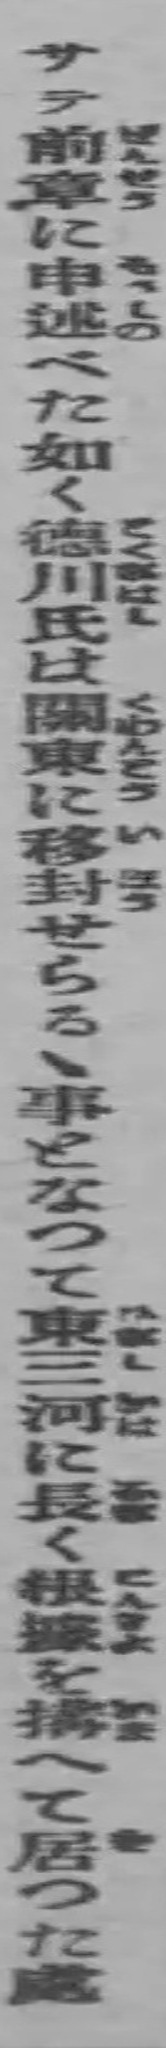サテ前章に申述べた如く徳川氏は関東に移封せらるゝ事となつて東三河に長く根拠を搆へて居つた処
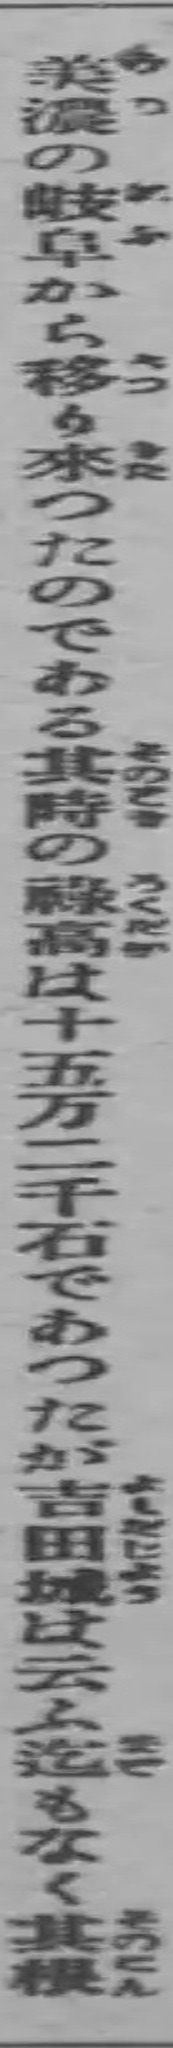る美濃の岐阜から移り来つたのである其時の禄高は十五万二千石であつたが吉田城は云ふ迄もなく其根
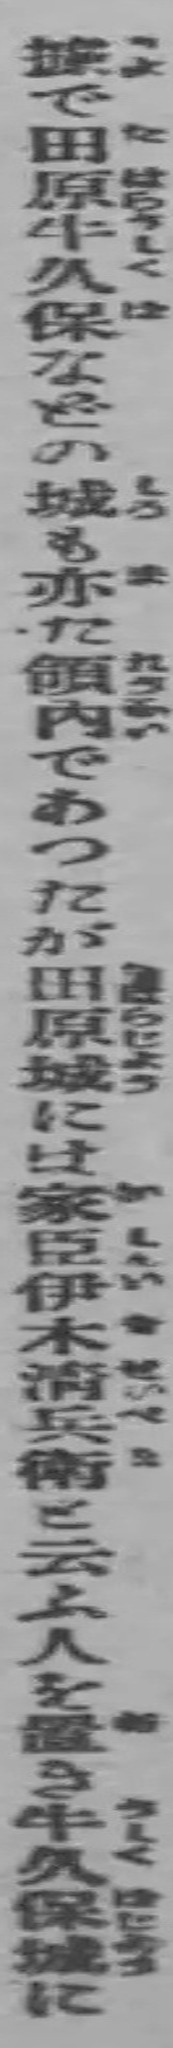伊木清兵衛拠で田原牛久保などの城も亦た領内であつたが田原城には家臣伊木清兵衛と云ふ人を置き牛久保城に
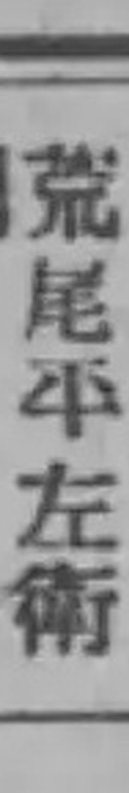荒尾平左衛門殿
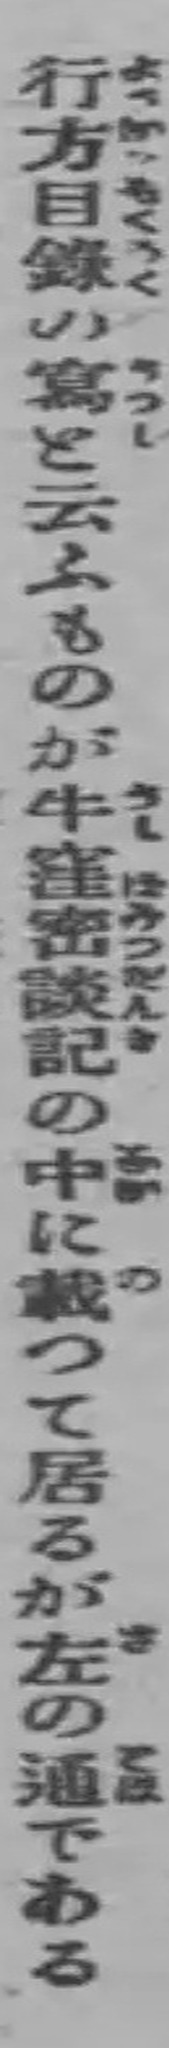行方目録の写と云ふものが牛久保密談記の中に載つて居るが左の通りである
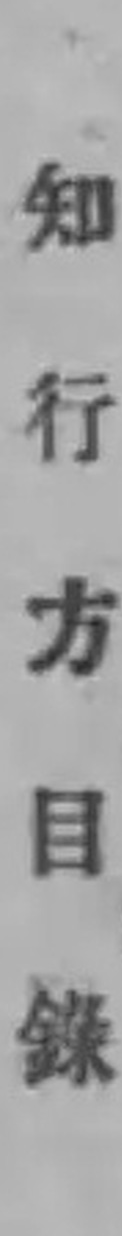知行方目録
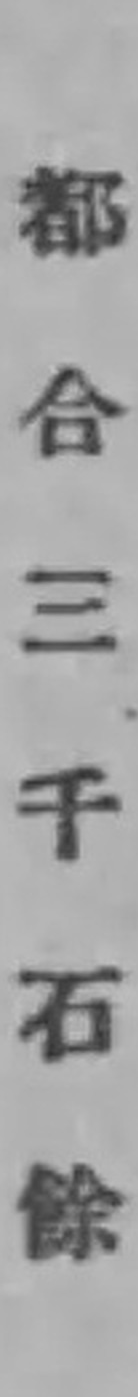都合三千石余
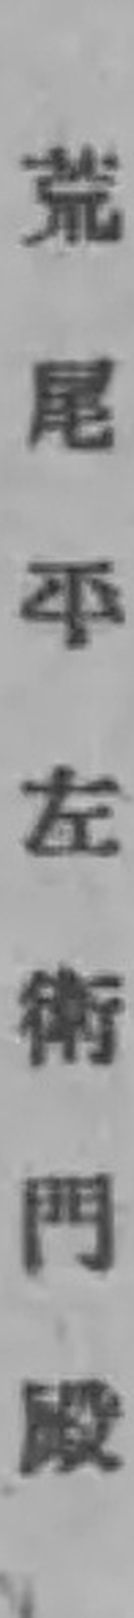荒尾平左衛門殿
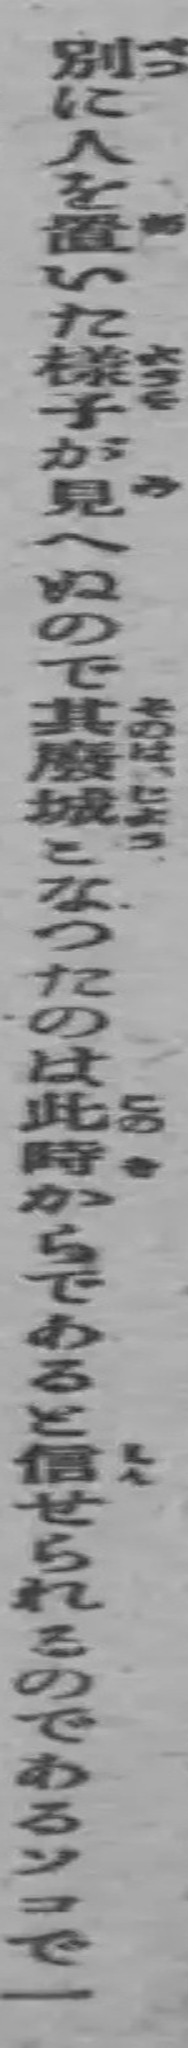別に人を置いた様子が見へぬので其廃城となつたのは此時からであると信ぜられるのであるソコで一
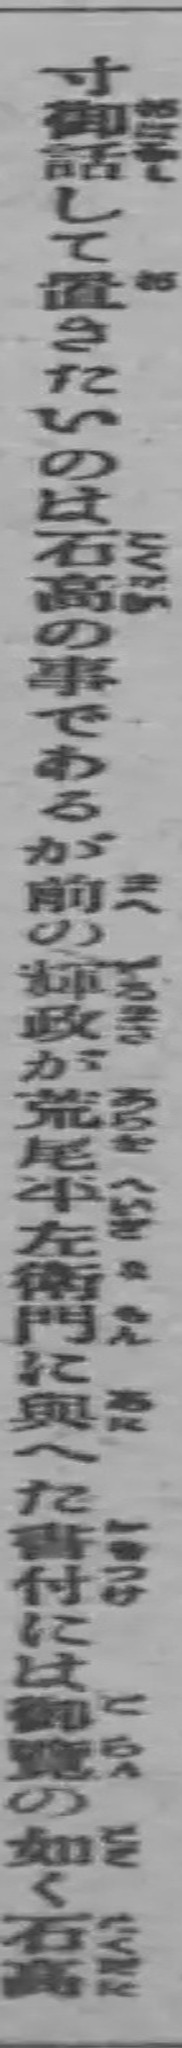貫高と石高寸御話して置きたいのは石高の事であるが前の輝政が荒尾平左衛門に与へた書付には御覧の如く石高
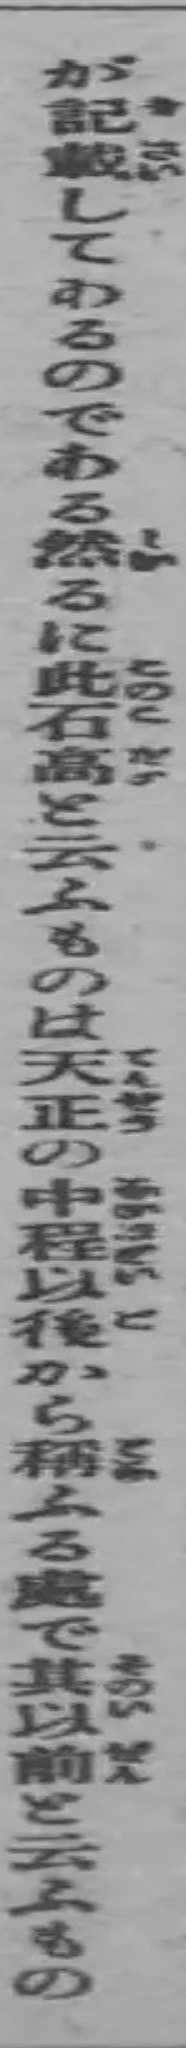が記載してあるのである然るに此石高と云ふものは天正の中程以後から称ふる処で其以前と云ふもの
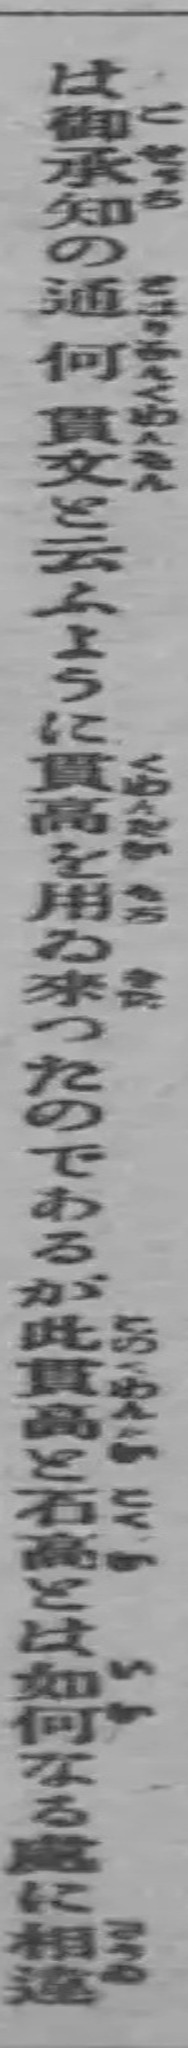は御承知の通何貫文と云ふように貫高を用ゐ来つたのであるが此貫高と石高とは如何なる処に相違
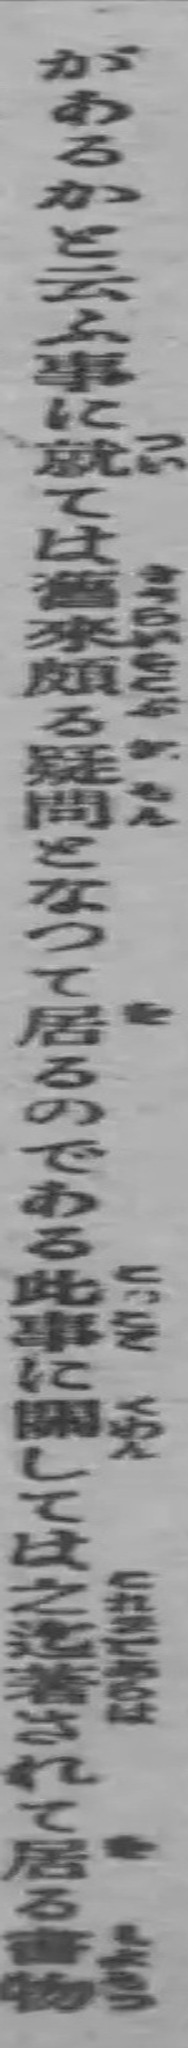があるかと云ふ事に就ては旧来頗る疑問となつて居るのである此事に関しては之迄著されて居る書物
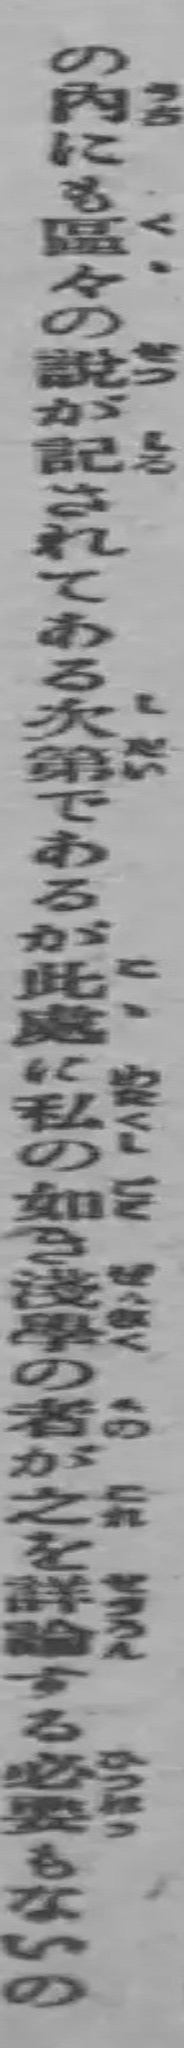の内にも区々の説が記されてある次第であるが此処に私の如き浅学の者が之を詳論する必要もないの
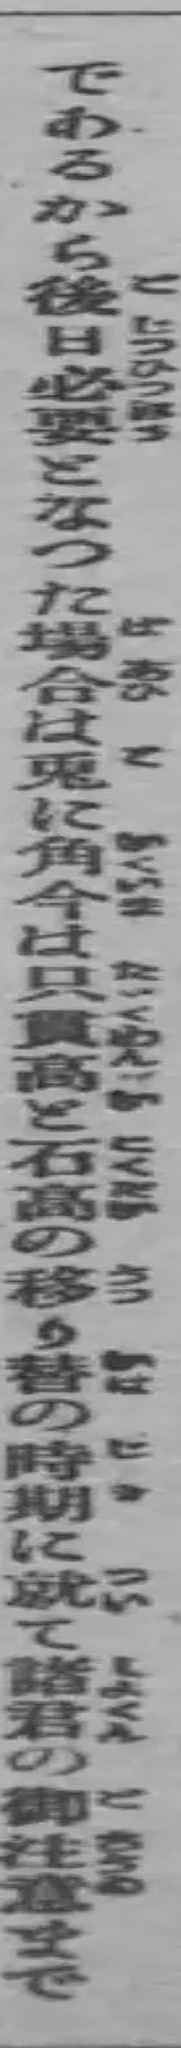であるから後日必要となつた場合は兎に角今は只貫高と石高の移り替の時期に就て諸君の御注意まで
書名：豊橋市史談
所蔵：国立国会図書館 National Diet Library, JAPAN
